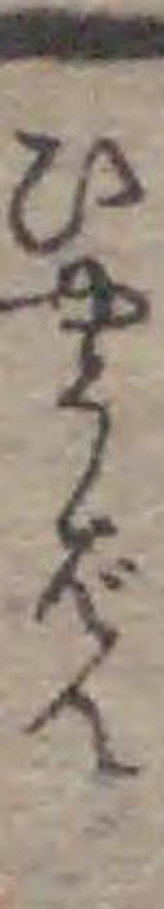ひやうばん
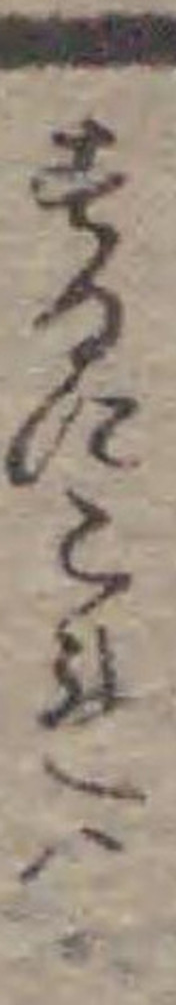するにこれは
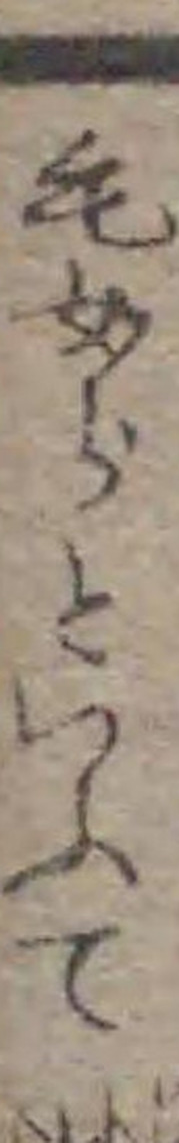毛女郎といふて
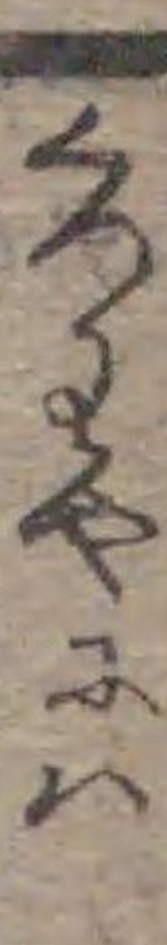くつわやには
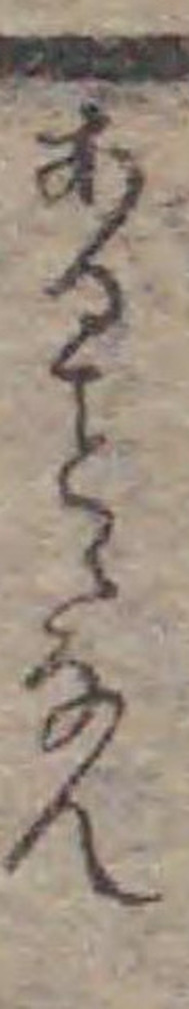あることゝなん
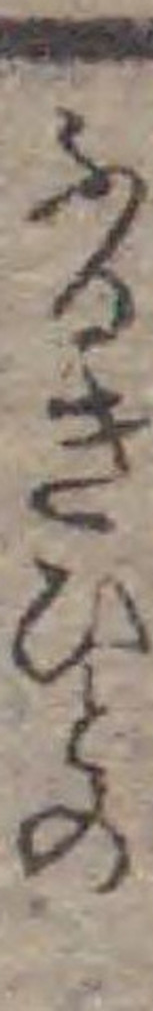ふるきひとの
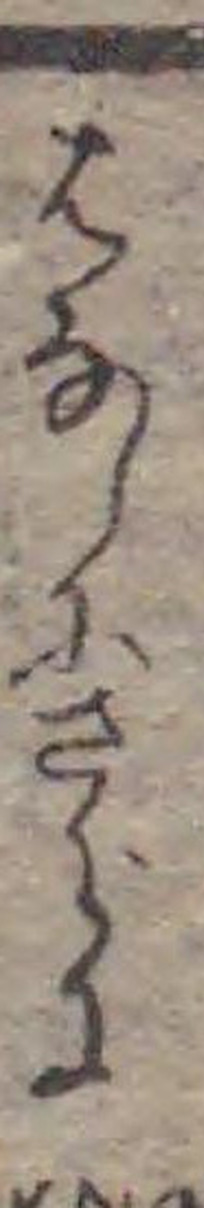はなしにさらに
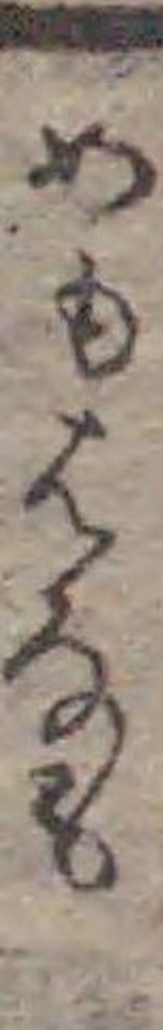めもはなも
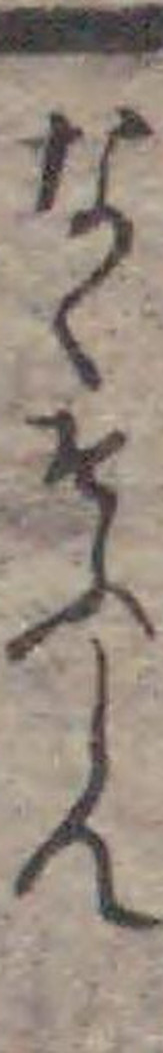なくそふしん
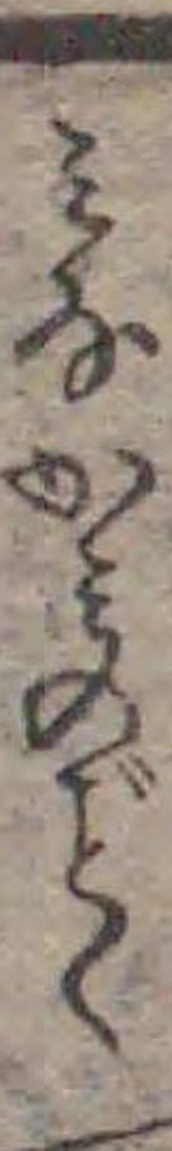みなかみのごとく
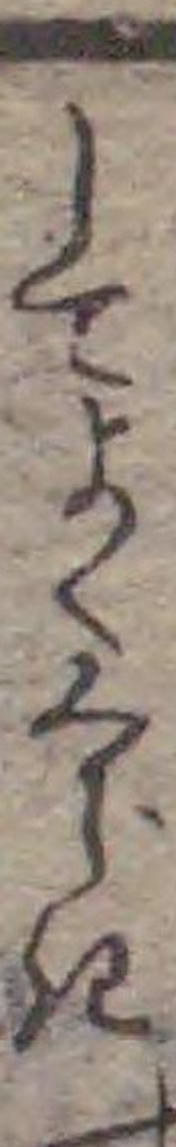してよくくらき
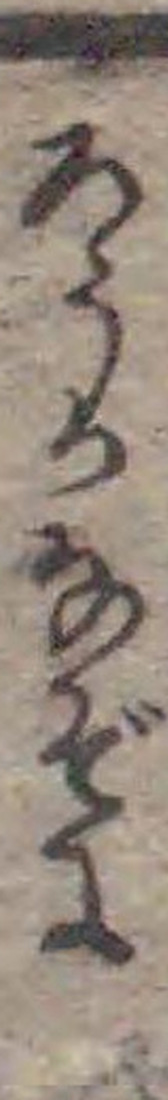ろうかなぞに
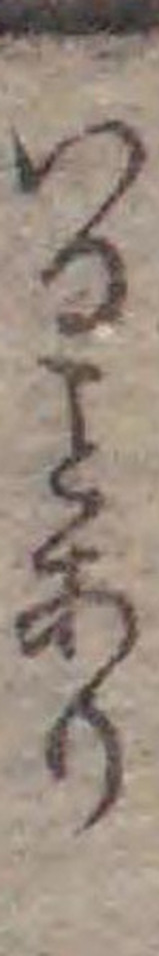いることあり
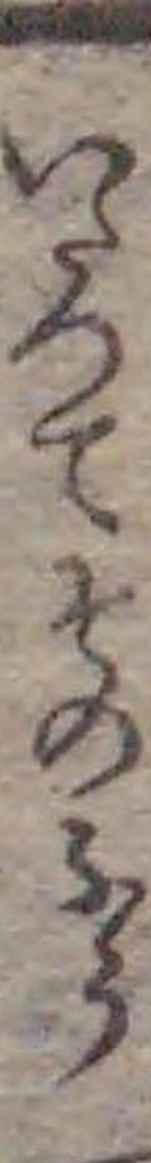いたつてそのふう
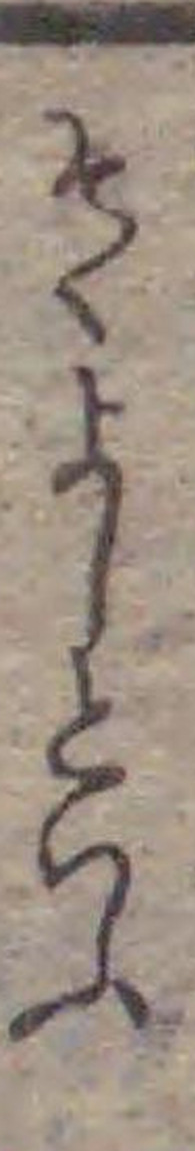そくよしといふ

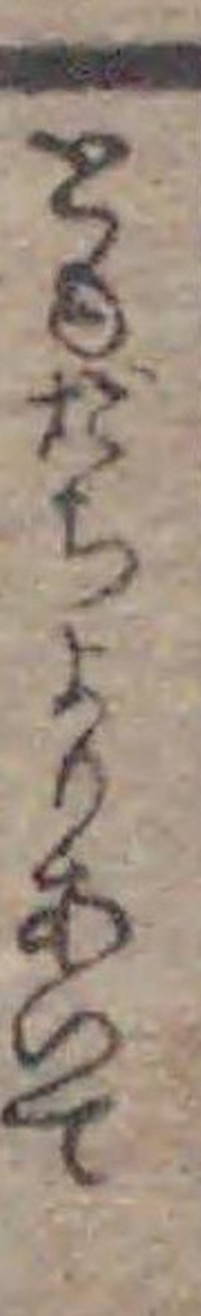ともだちよりあいて
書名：変化物春遊 : 2巻
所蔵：国立国会図書館 National Diet Library, JAPAN
